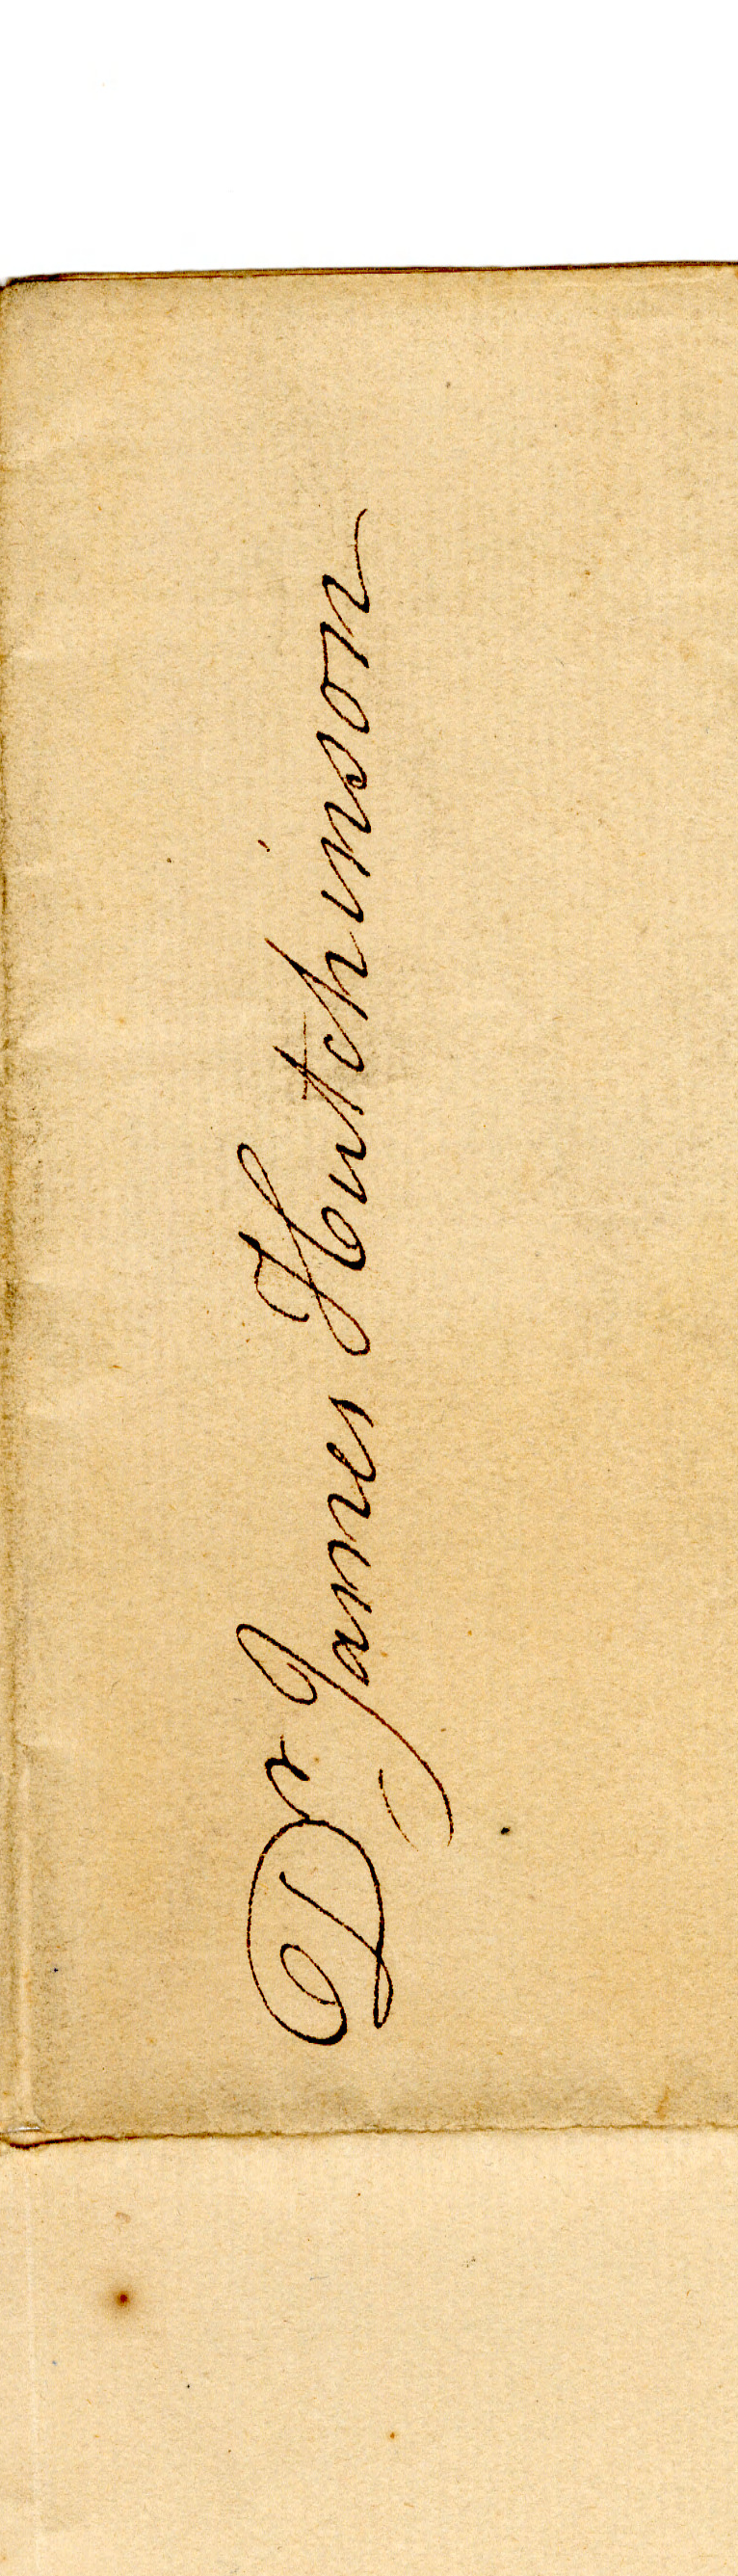D^r James Hutchinson
